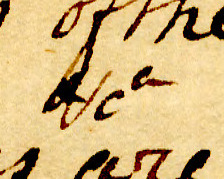&c^a
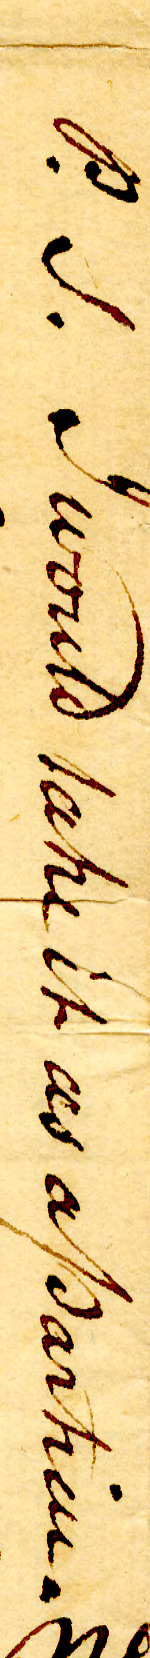P.S. I would take it as a particu-
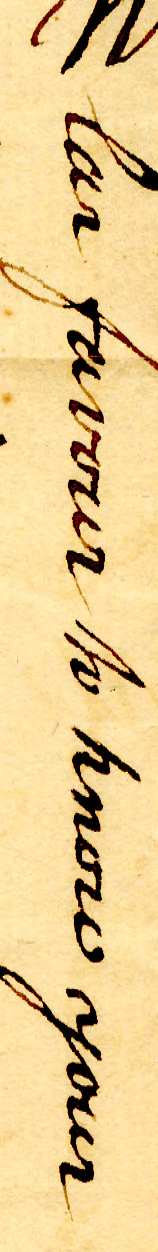lar favour to know your
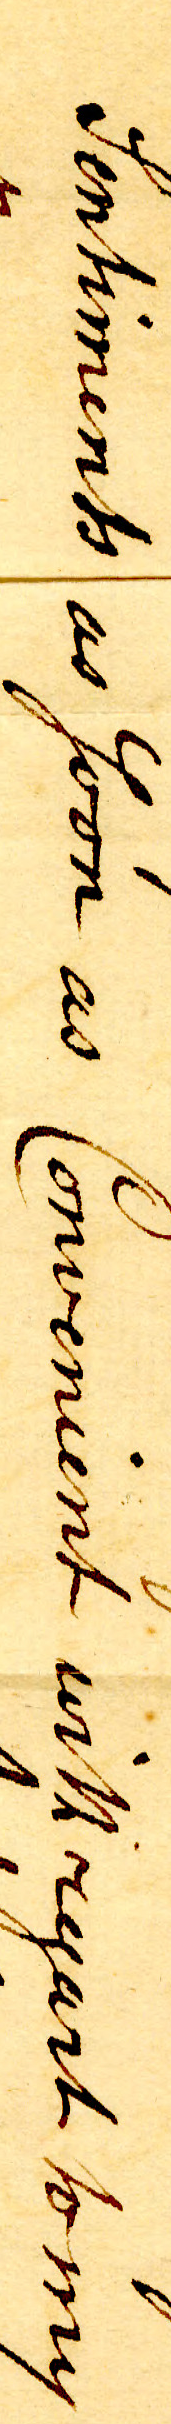Sentiments as Soon as Convenient with regard to my
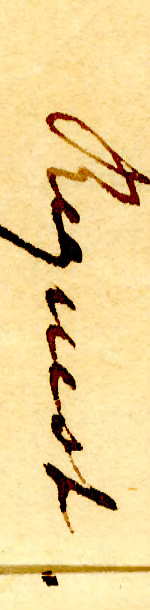Request
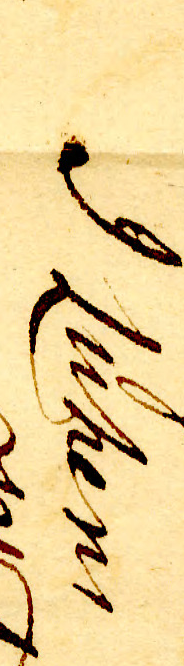J Lukens
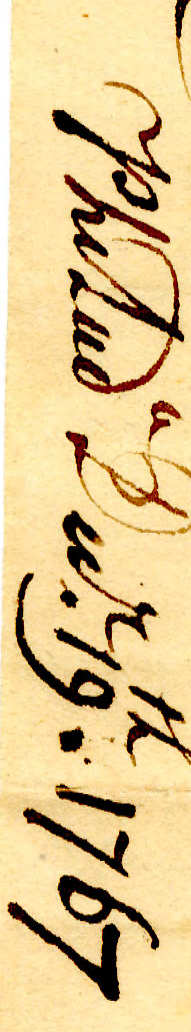Philad^a Dec^r. 19^th. 1767
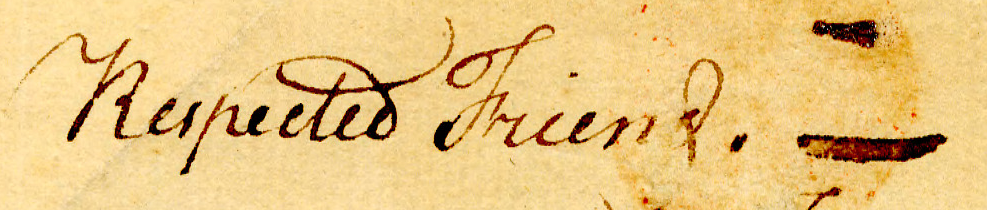Respected Friend.-
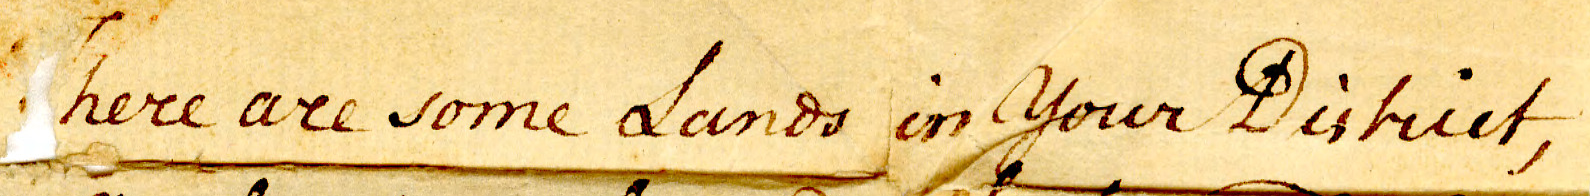There are some Lands in your District,
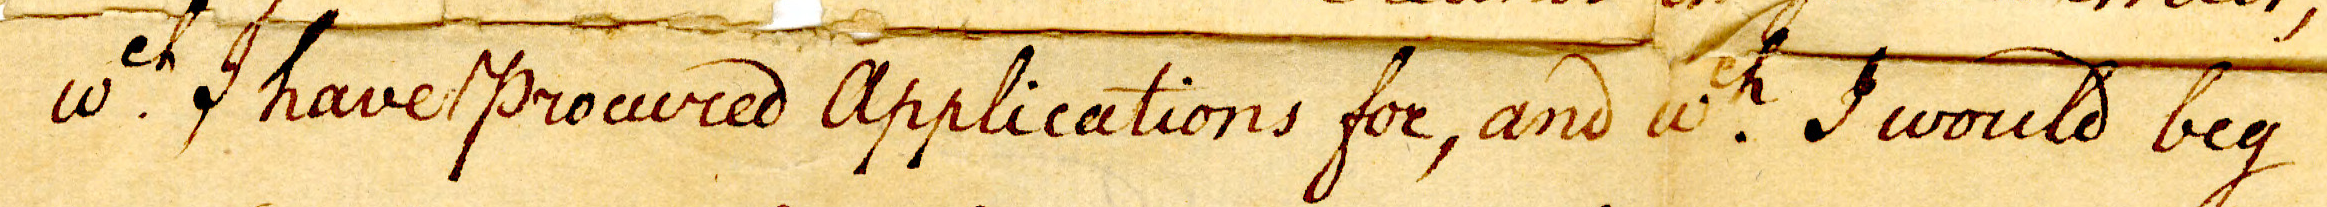w^ch. I have procured Applications for, and w^ch. I would beg
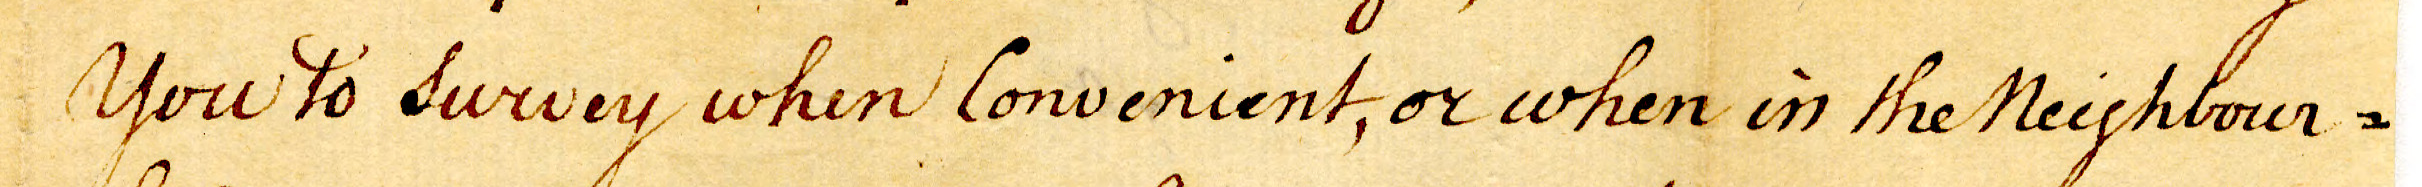you to survey when Convenient, or when in the Neighbour-
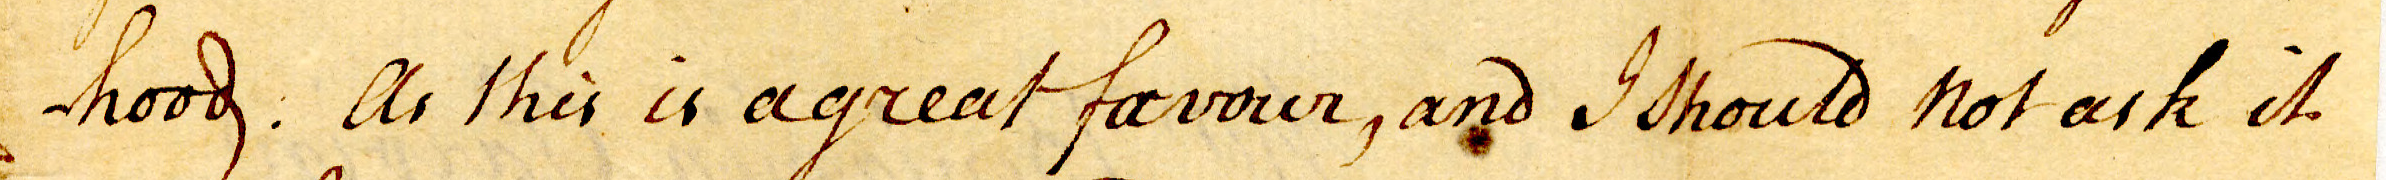-hood. As this is a great favour, and I should not ask it
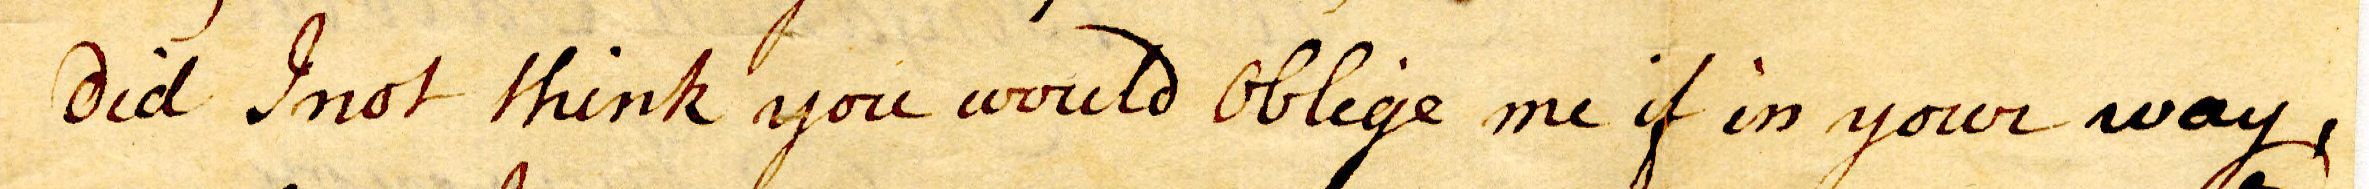did I not think you would oblige me if in your way,
